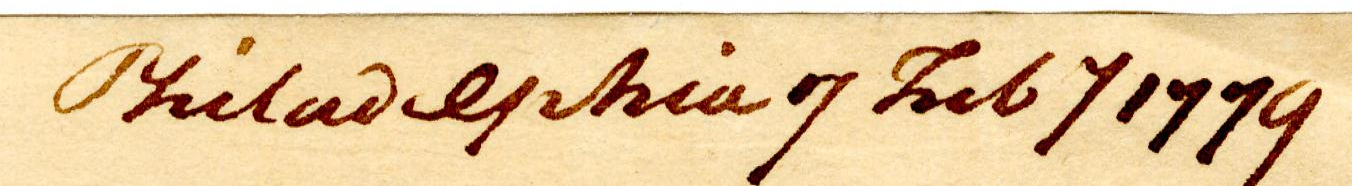Philadelphia 7 Feb^y 1779
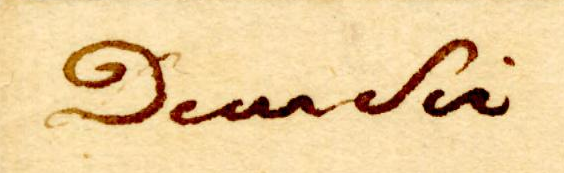Dear Sir
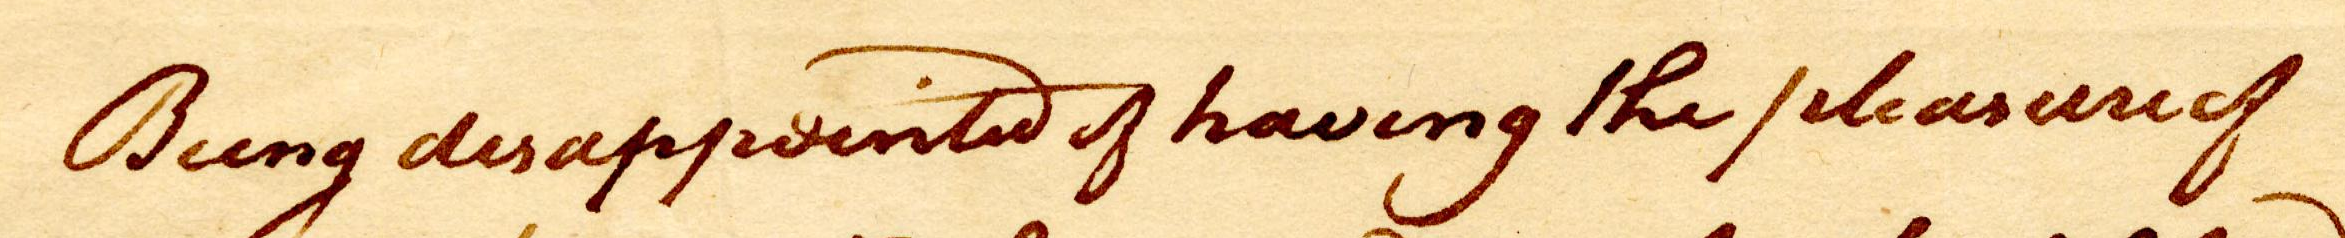Being disappointed of having the pleasure of
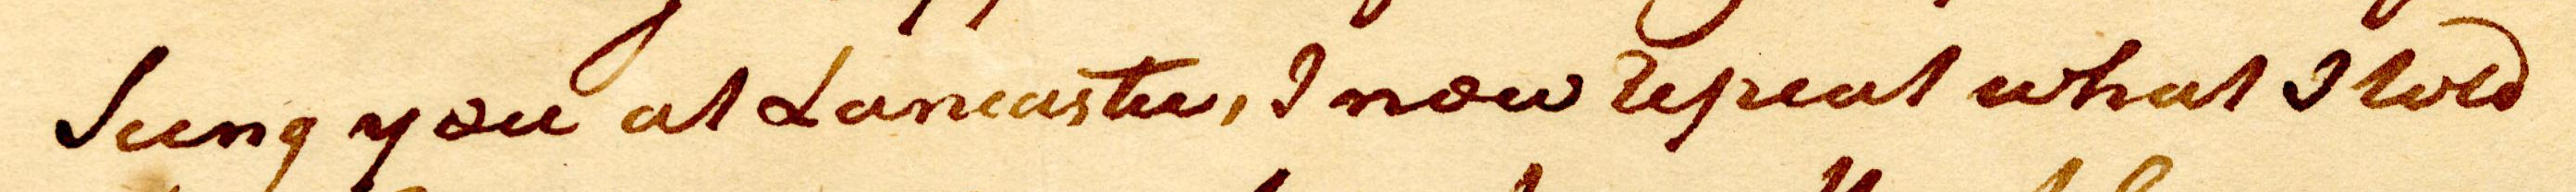Seeing you at Lancaster, I now repeat what I told
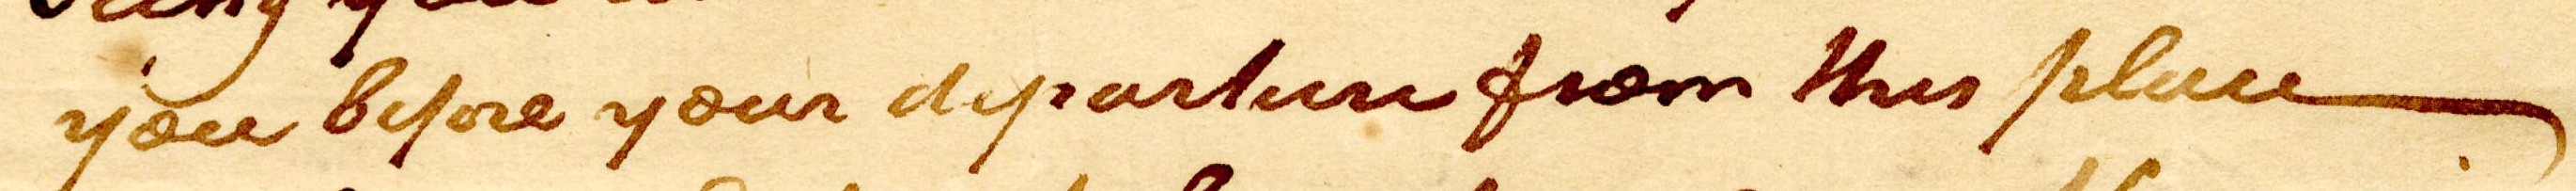you before your departure from this place
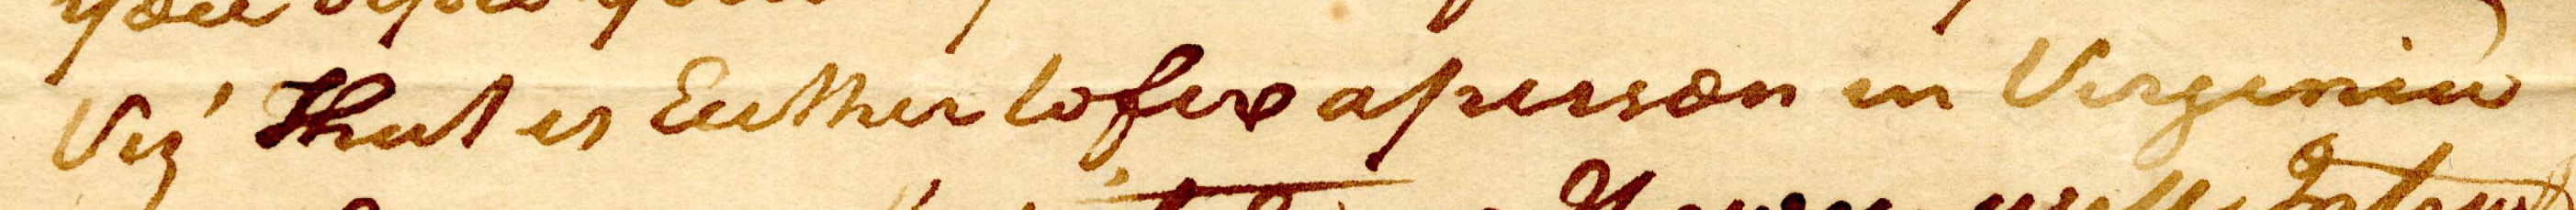Viz^t that is Either before a person in Virginia
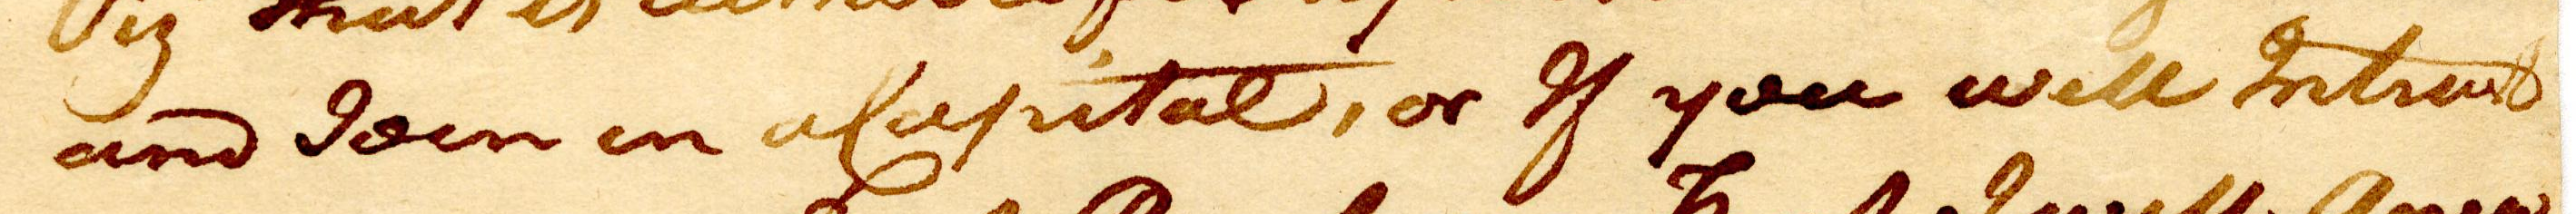and I am in a Capital, or if you will Intrust
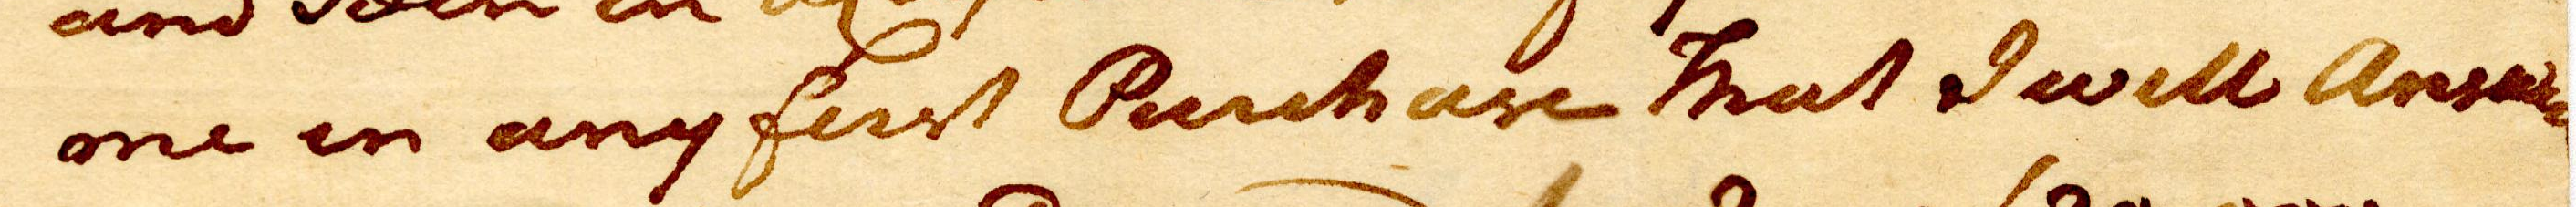me in any first Purchase that I will Answer
